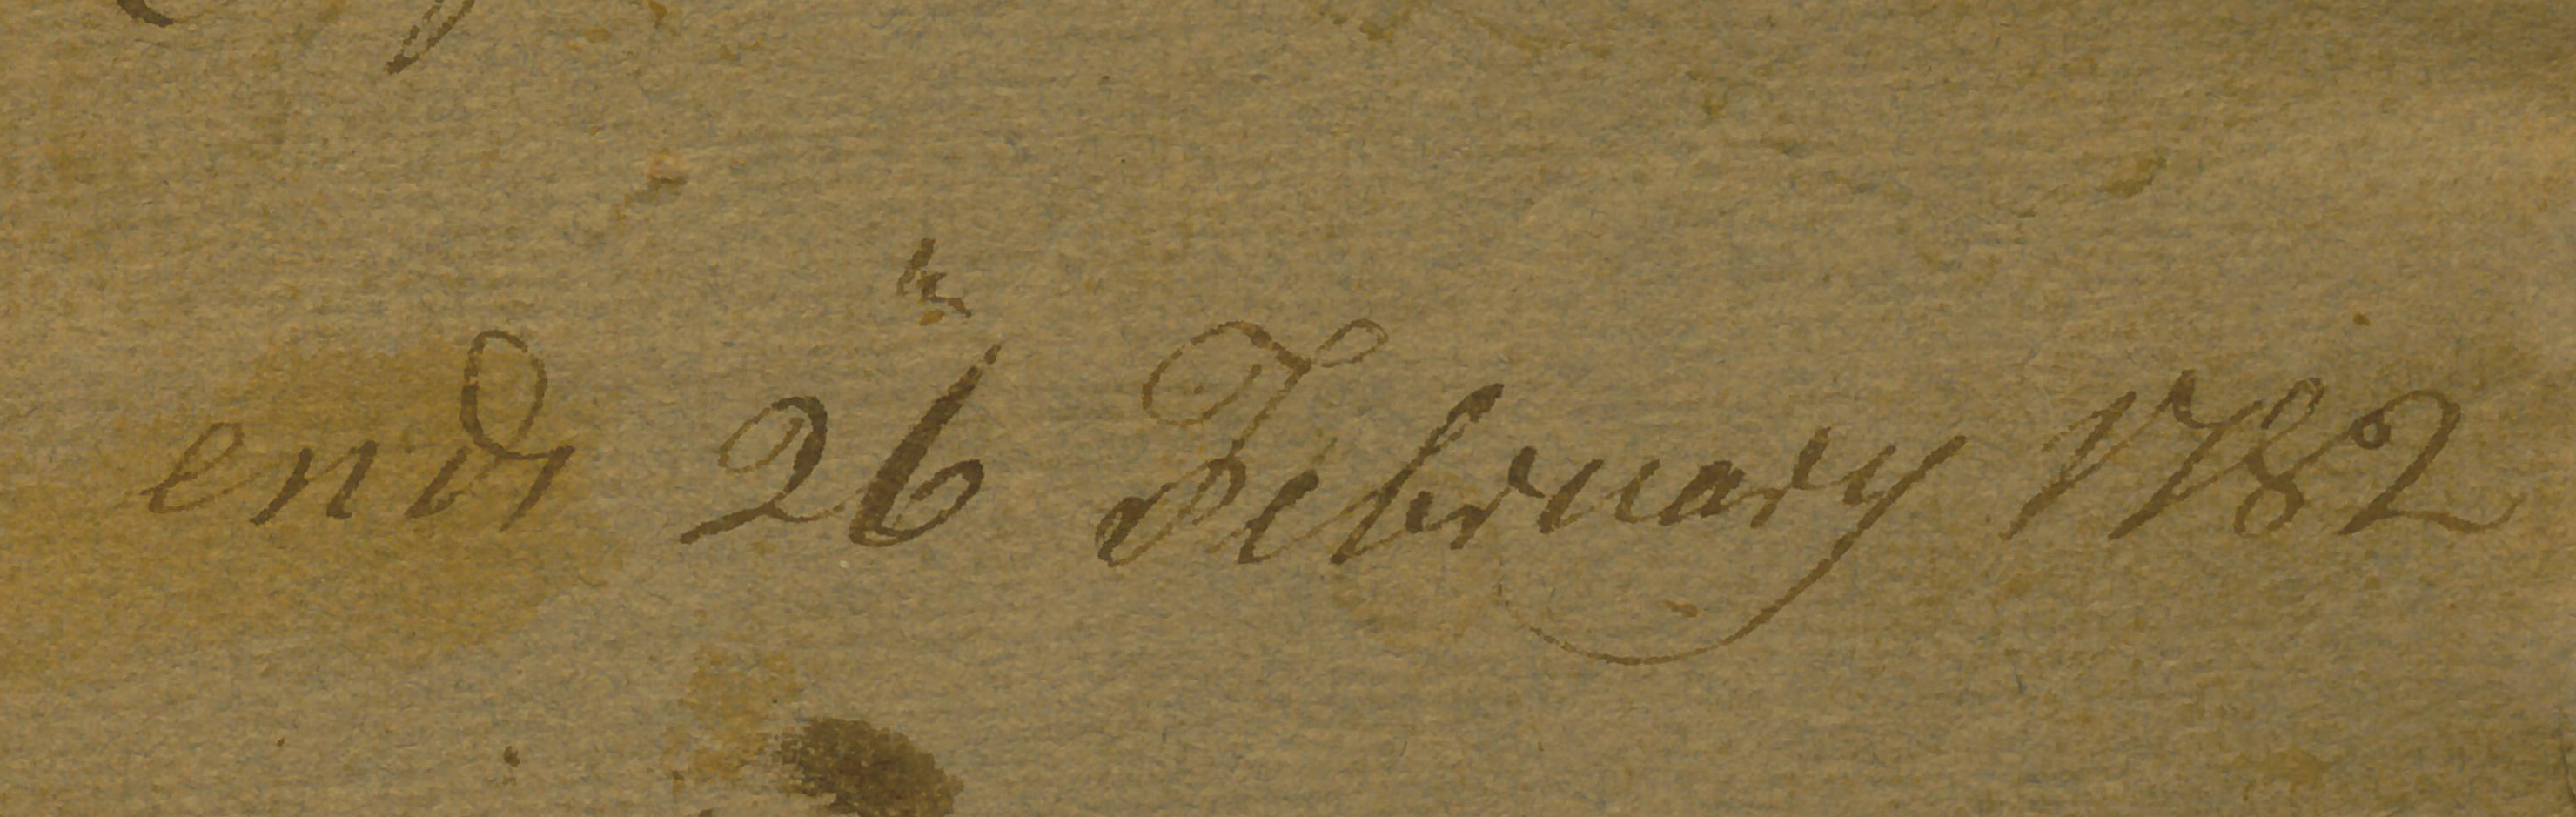ends 26 February 1782
